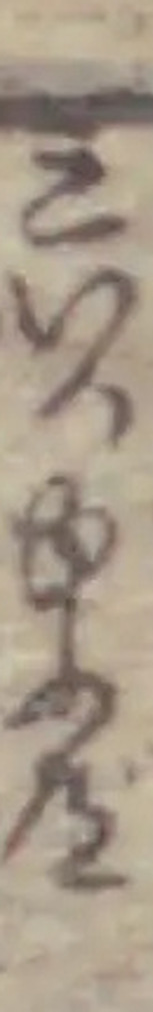こいつゆふべ
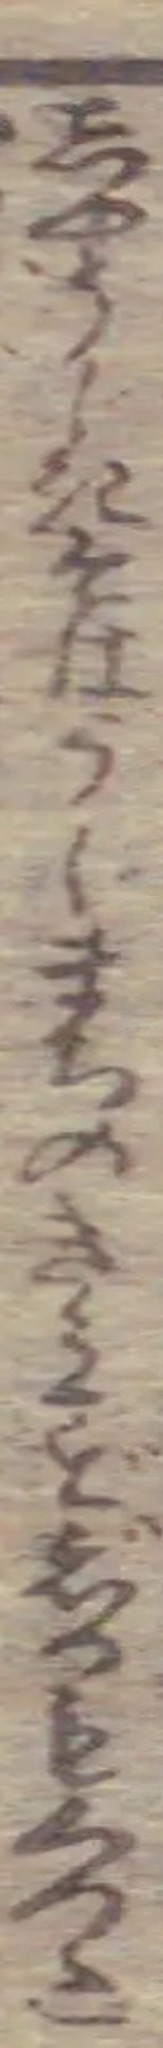しやうじきそはかしまちのきらずじるもくつた
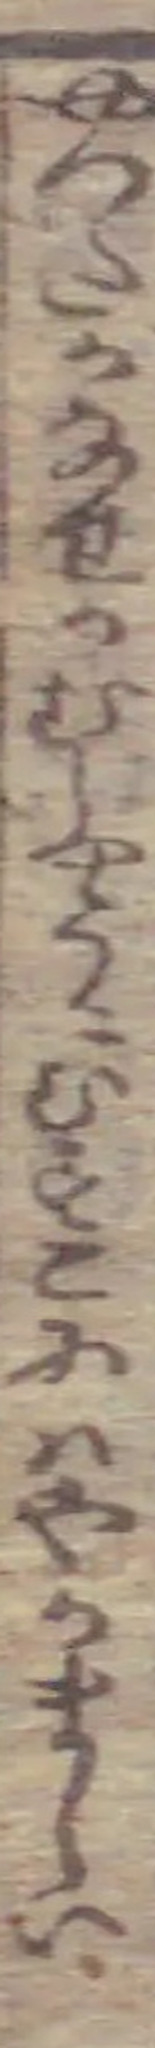やつたかなせかむしやうにむすこにはやかましい

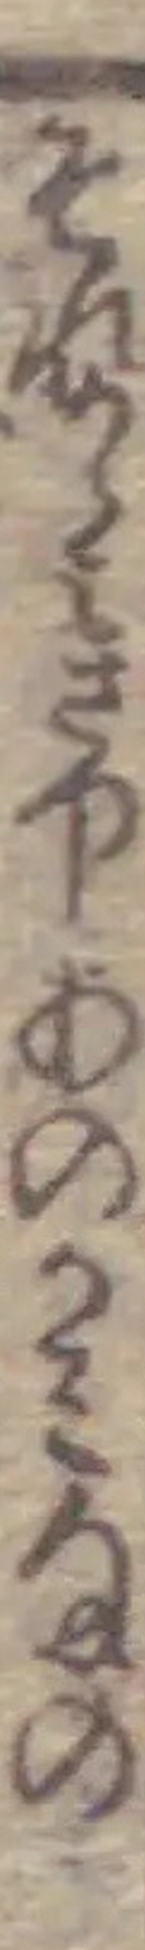それからみさつしあのかみ様の
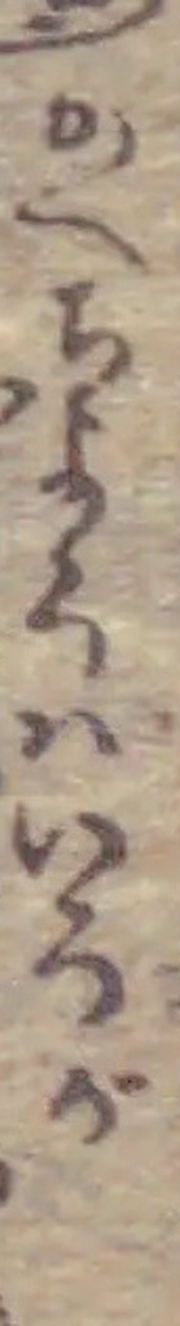かへちようはいろが
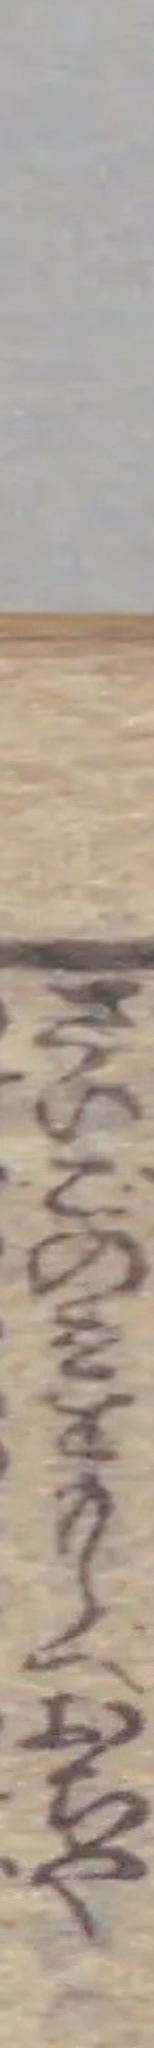さいごのみをもらへおちや
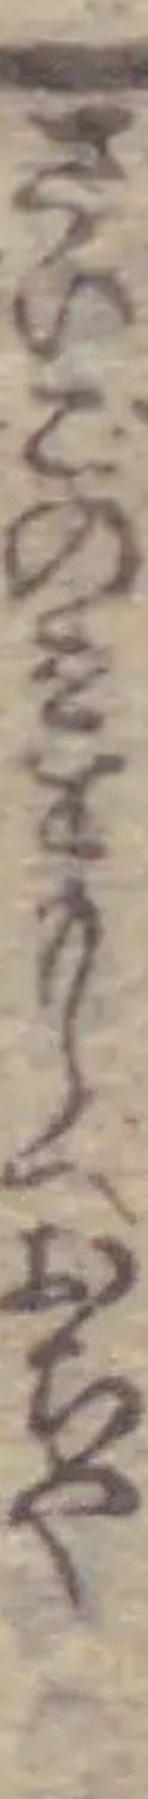さいごのみをもらへおちや
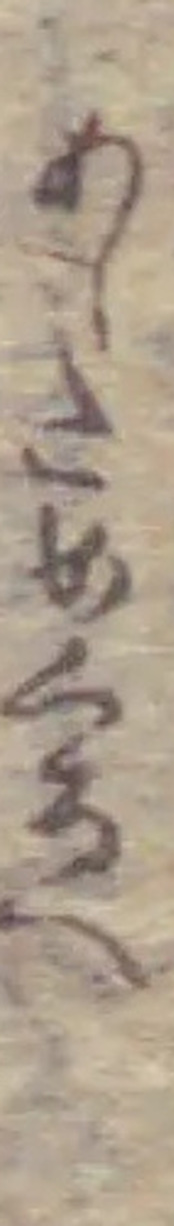あしためくろへ
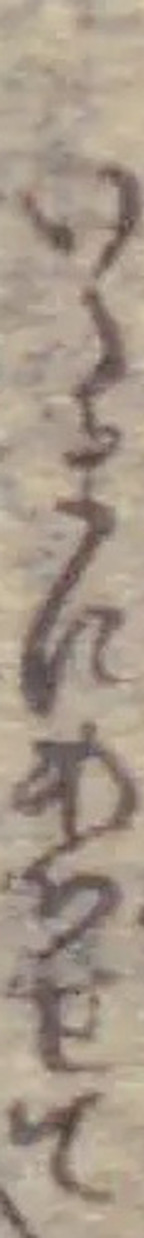いくまにあはせて
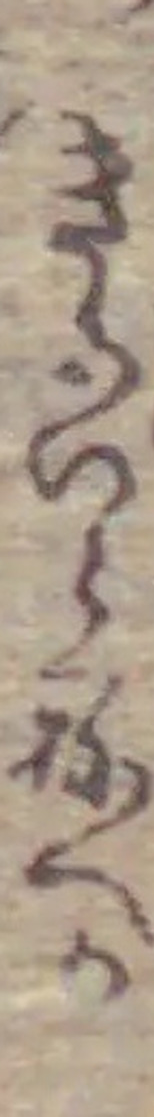きらいねへか
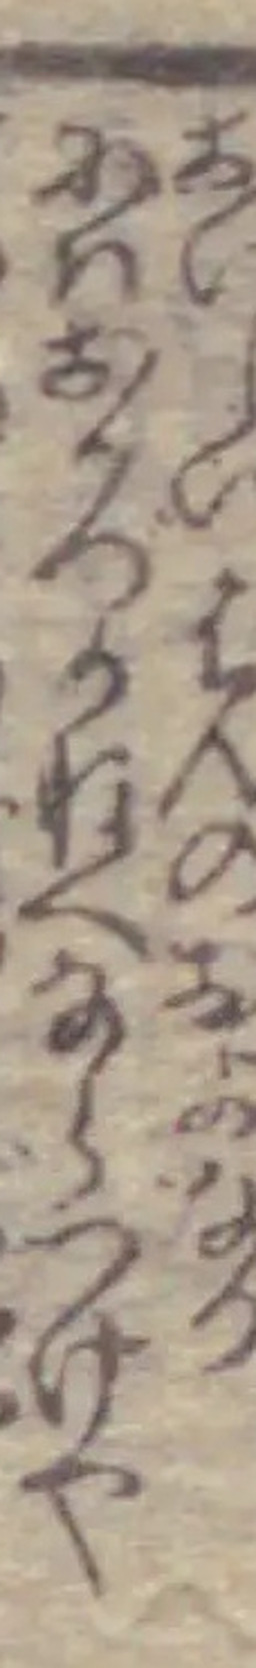にはおかづかねへならつけや
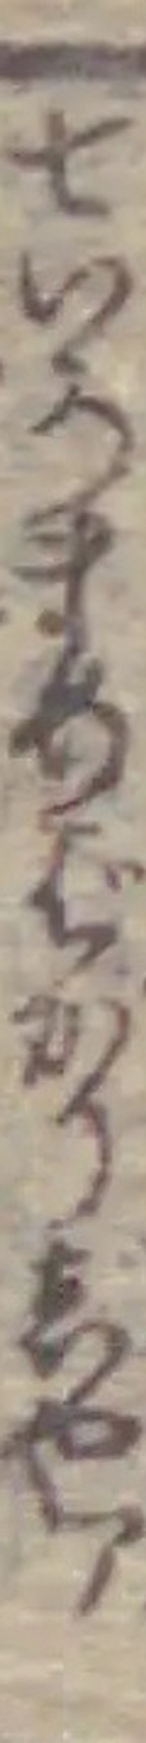七いろまめばかりじやァ
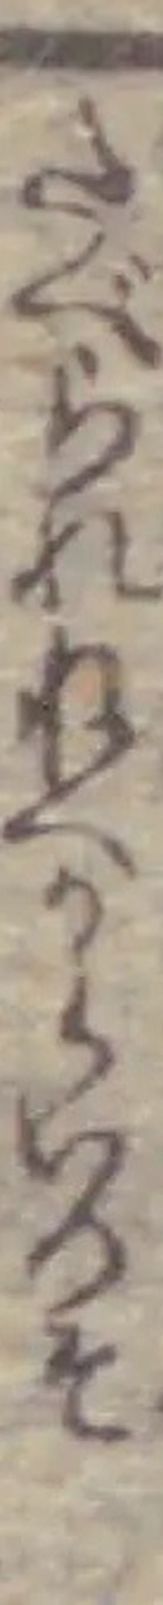たべられねへからいつそ
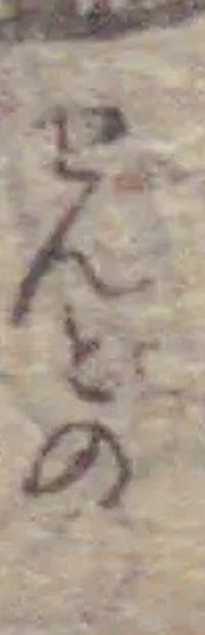こんとの
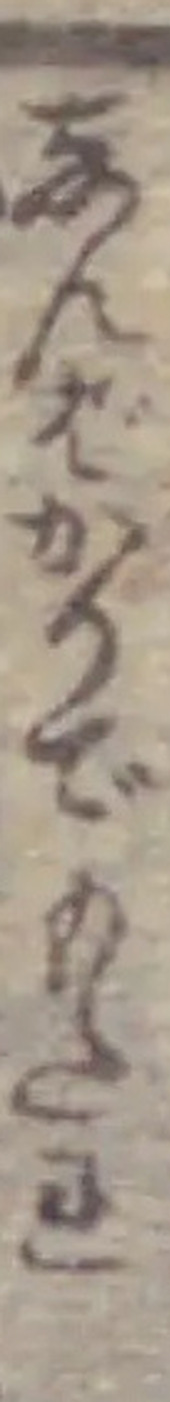しんばかりでもたれ
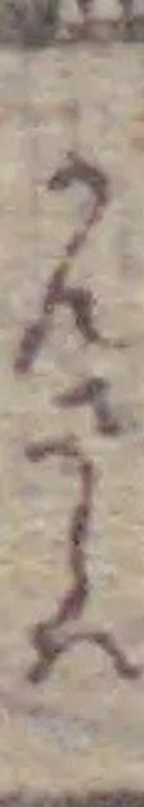かんさしは
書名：化物大閉口 2巻
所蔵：国立国会図書館 National Diet Library, JAPAN
